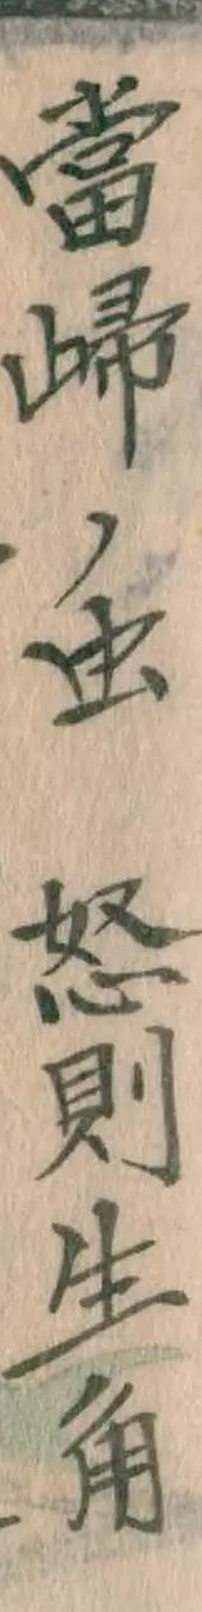当㱕ノ虫怒則生角
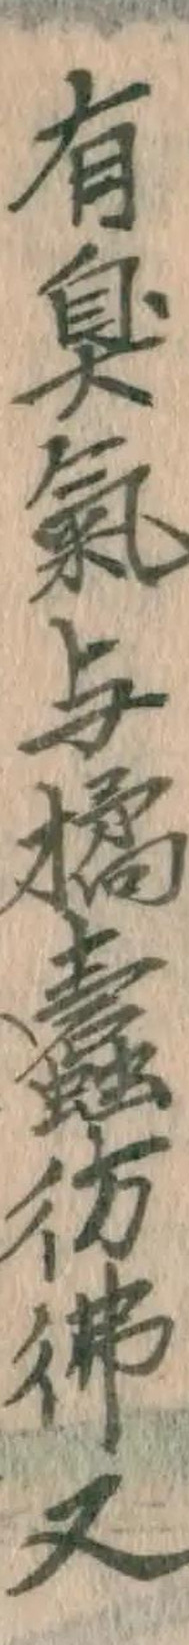有臭気与橘蠹彷彿又
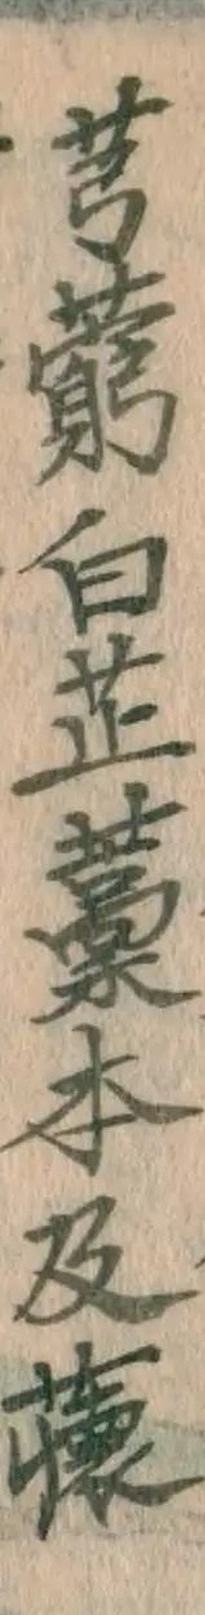芎藭白芷藁本及蘹
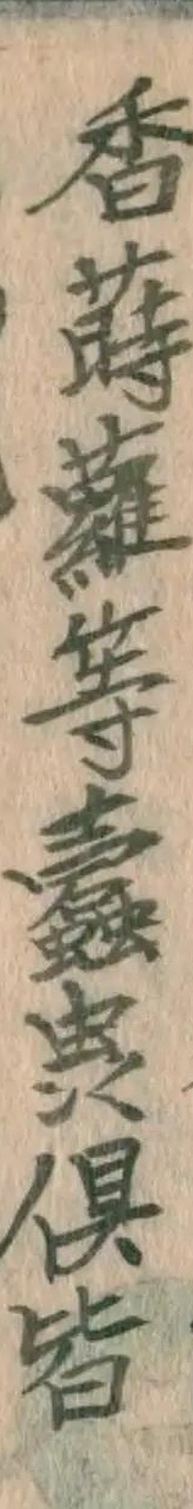香蒔蘿等蠹蟲倶皆
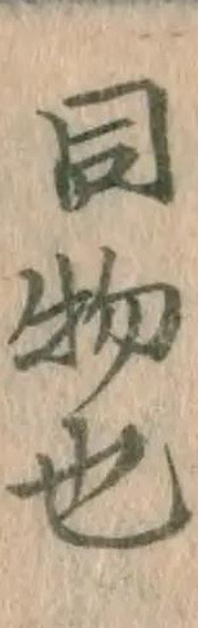同物也

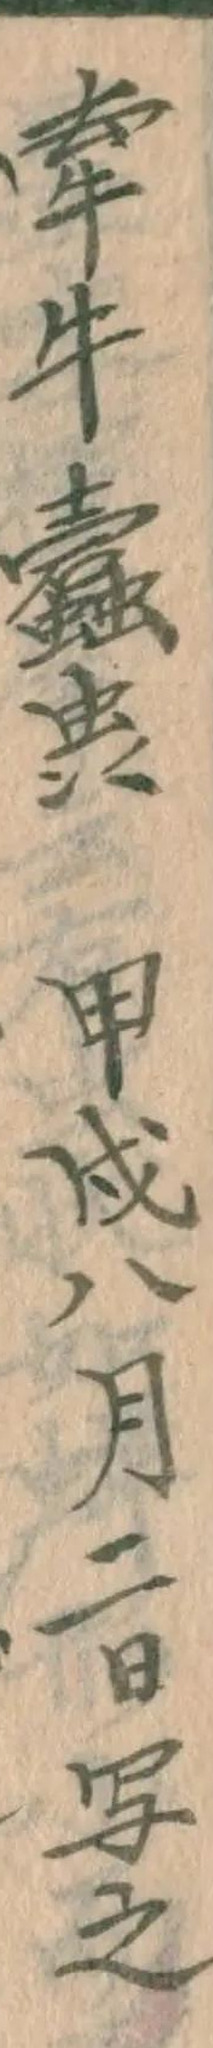牽牛蠹蟲甲戌八月二日写之
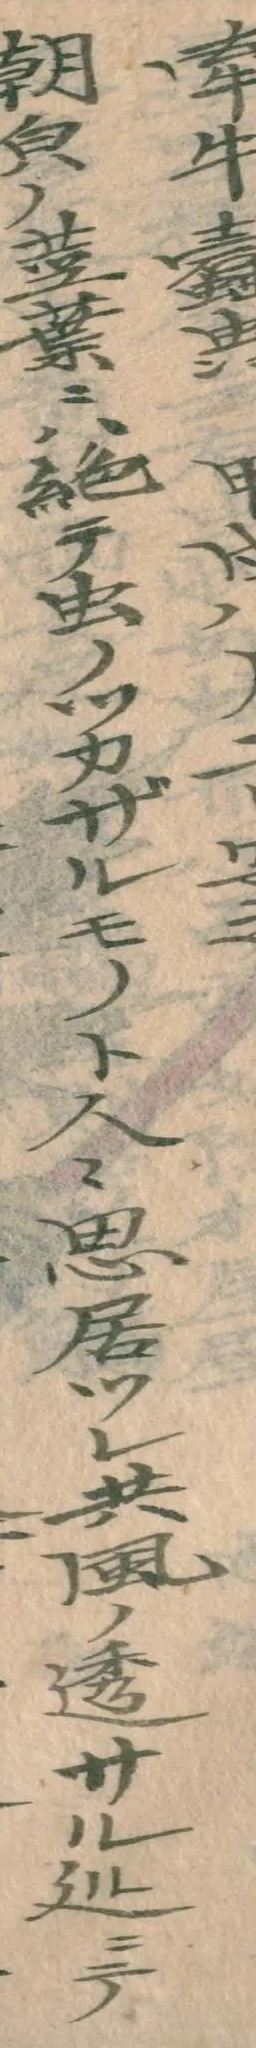朝皃ノ莖葉ニハ絶テ虫ノツカザルモノト人々思居ツレ共風ノ透サル処ニテ
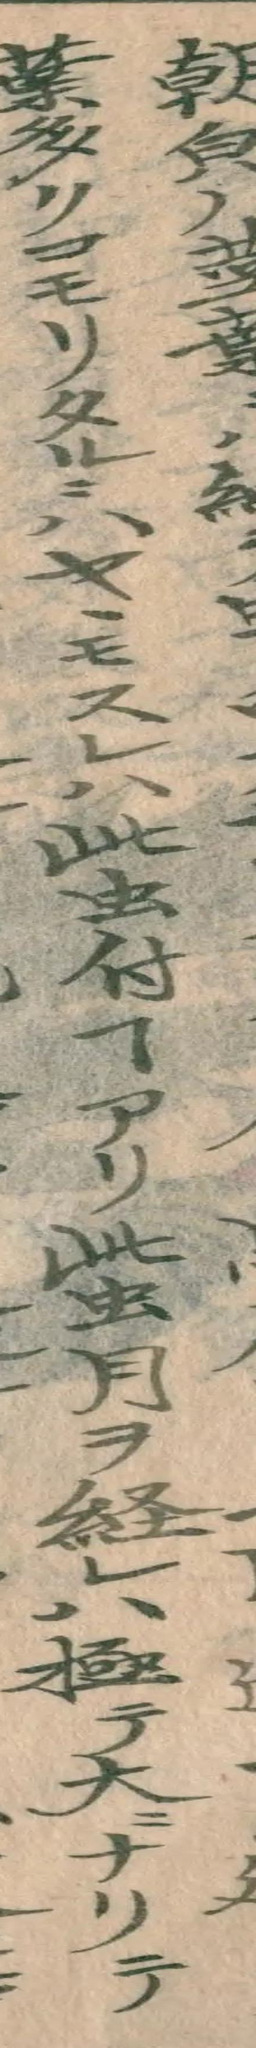葉多クコモリタルニハヤヽモスレハ此虫付コトアリ此虫月ヲ経レハ極テ大ニナリテ
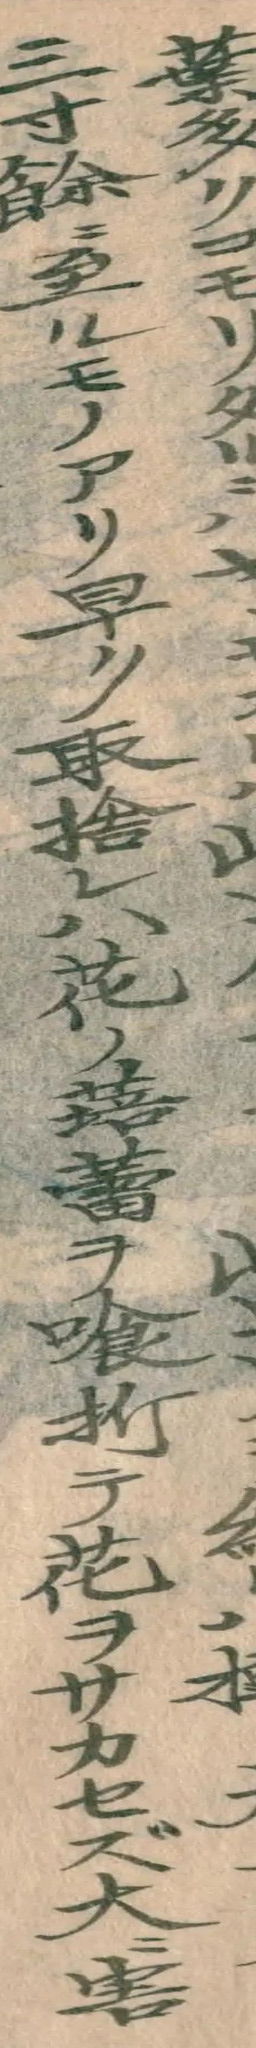三寸餘ニ至ルモノアリ早ク取捨レハ花ノ𦹷蕾ヲ喰折テ花ヲサカセズ大ニ害
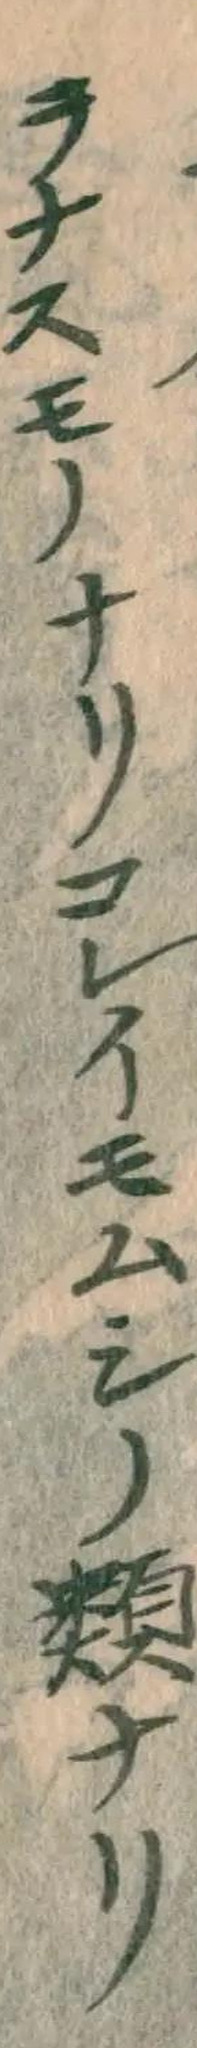ヲナスモノナリコレイモムシノ類ナリ

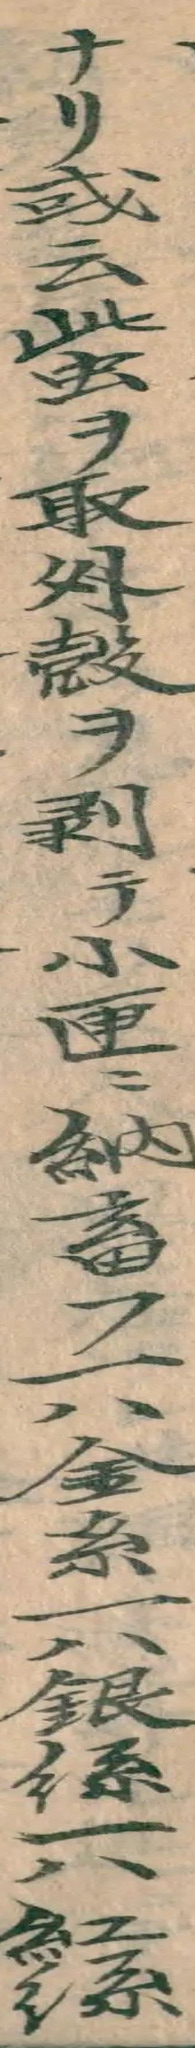ナリ或云此虫ヲ取外殻ヲ剥テ小匣ニ納蓄フ一ハ金糸一ハ銀糸一ハ紅糸
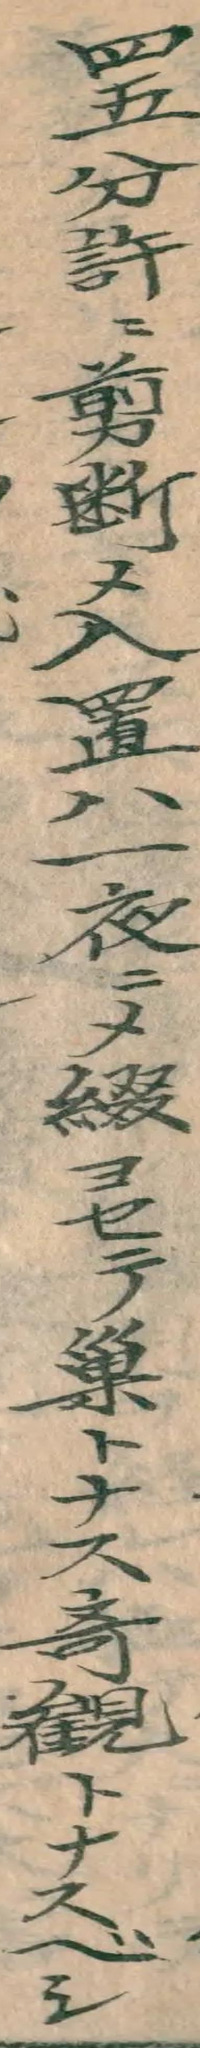四五分許ニ剪断シテ入置ハ一夜ニシテ綴ヨセテ巣トナス奇観トナスベシ
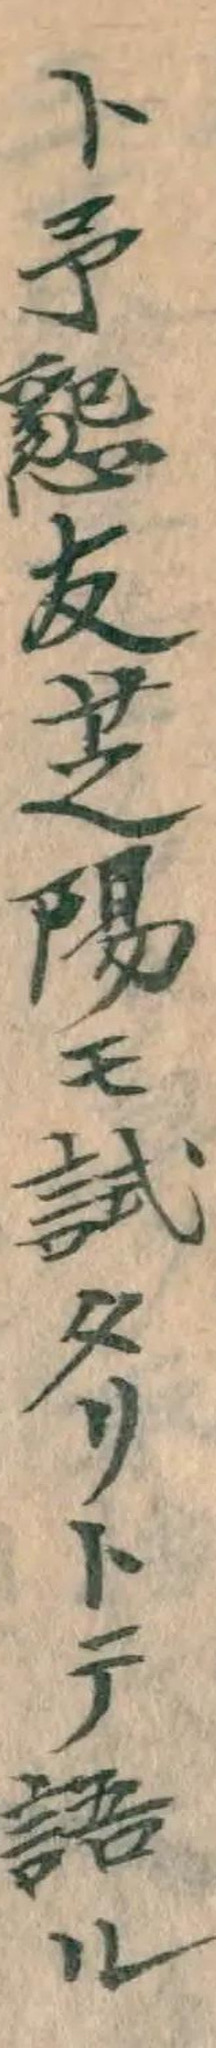ト予懇友芝陽モ試タリトテ語ル
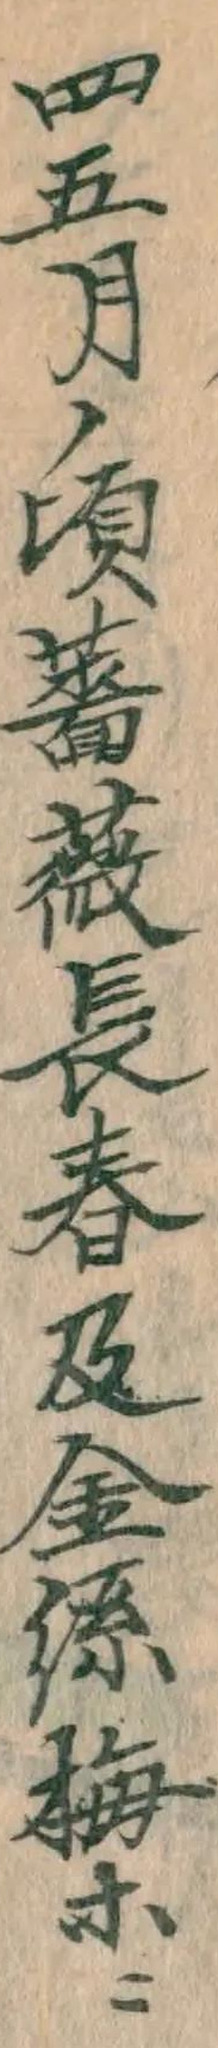四五月ノ頃薔薇長春及金糸梅等ニ
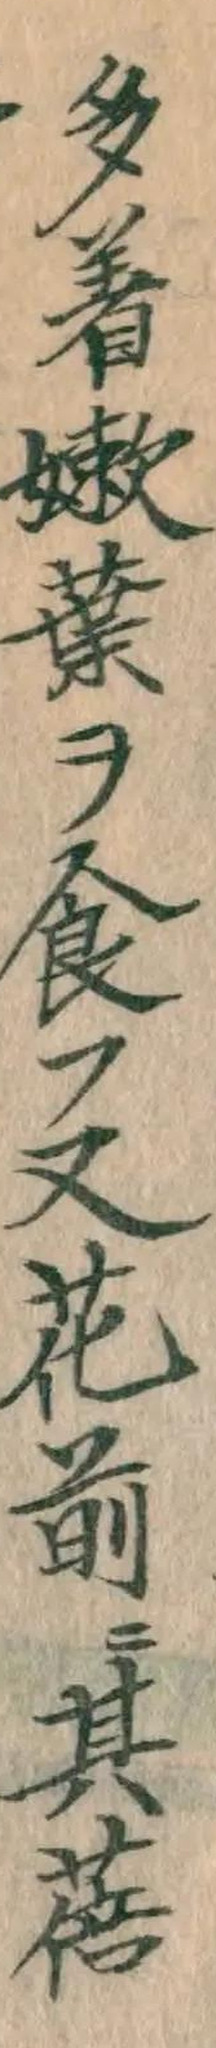多着嫩葉ヲ食フ又花前ニ其蓓
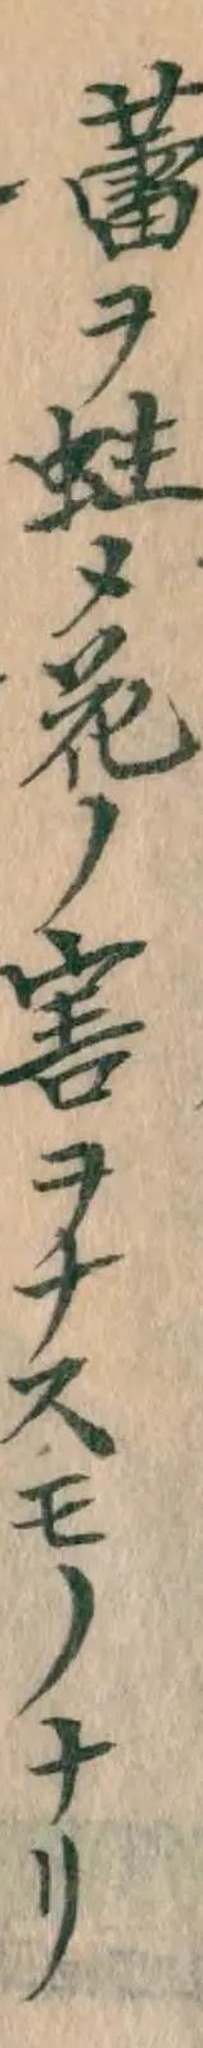蕾ヲ蛀シテ花ノ害ヲナスモノナリ
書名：千蟲譜 3巻. [3]
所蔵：国立国会図書館 National Diet Library, JAPAN
